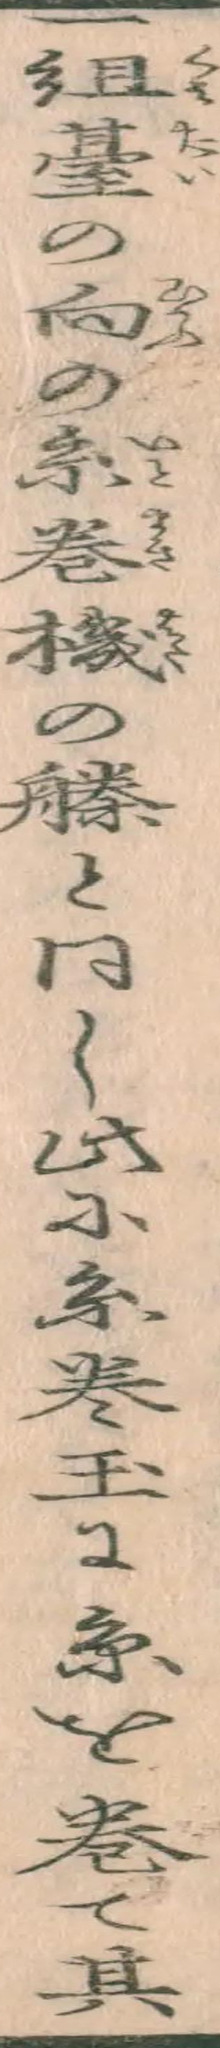一組台の向の糸巻機の𣚗と同し此に糸巻玉に糸を巻て其
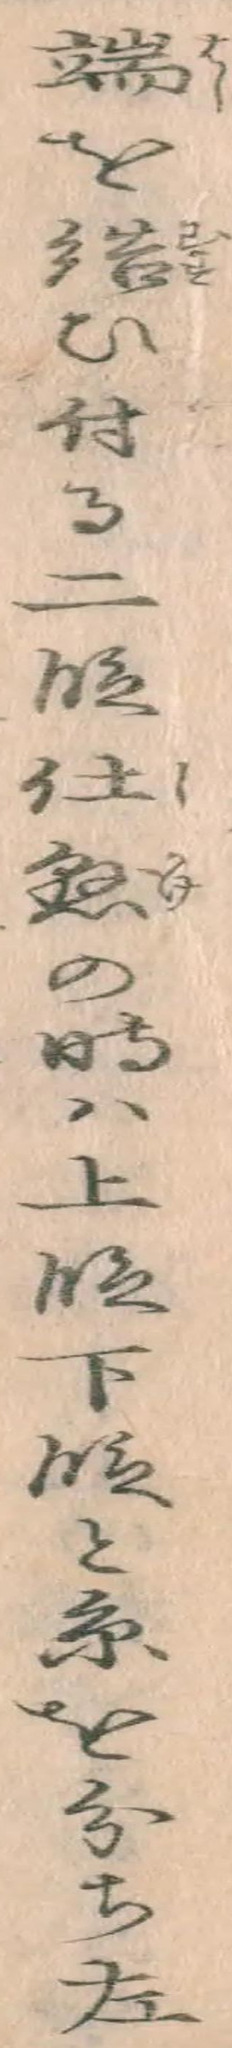端を結ひ付る二段仕懸の時は上段下段と糸を分ち左
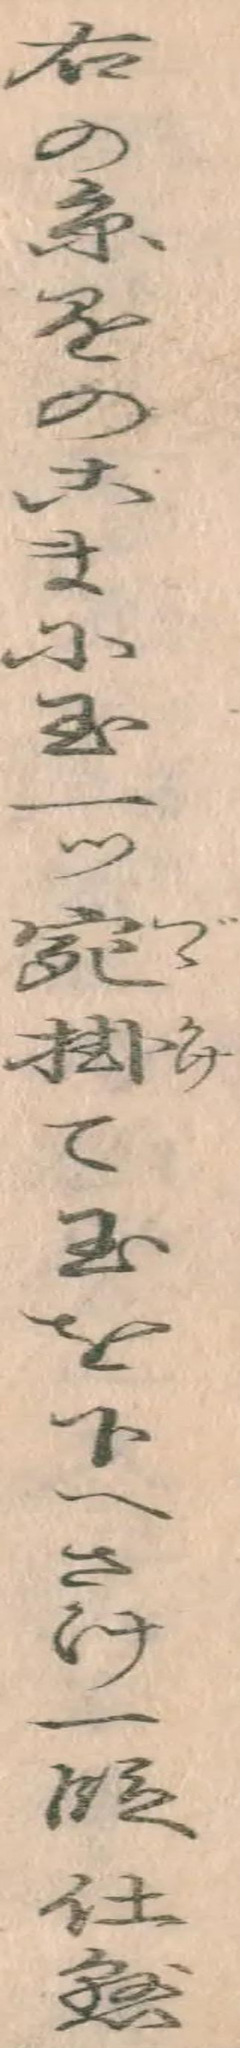右の糸懸のこまに玉一ッ宛掛て玉を下へさけ一段仕懸
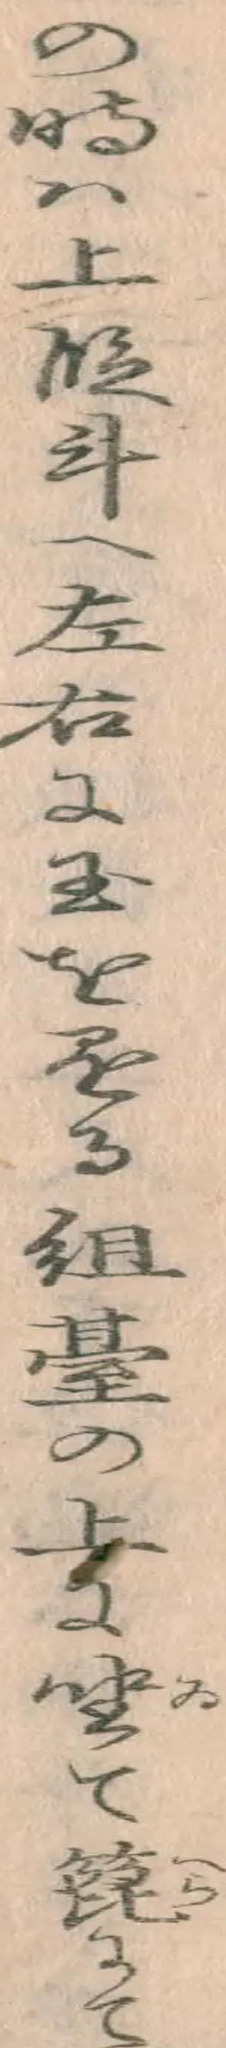の時は上段計へ左右に玉を懸る組台の上に坐て箆にて
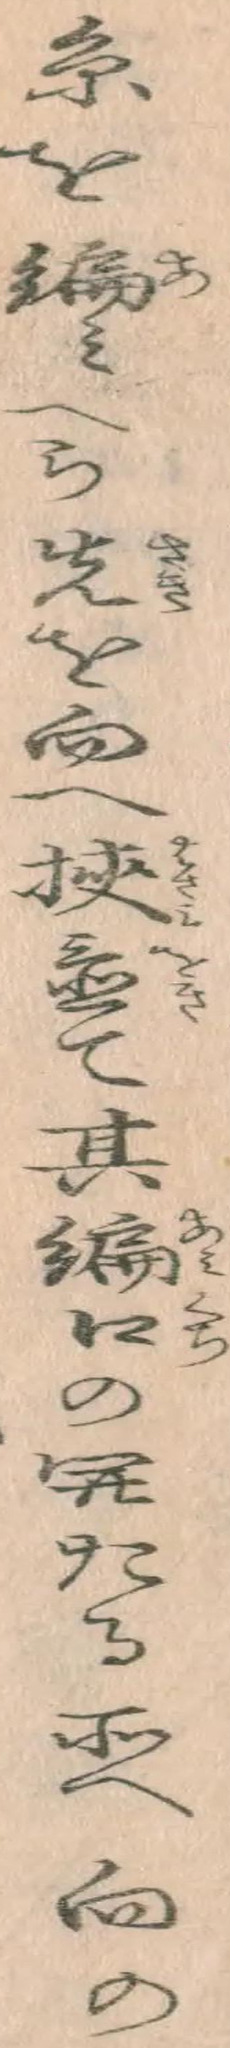糸を編みへら先を向へ挟置て其編口の開たる所へ向の
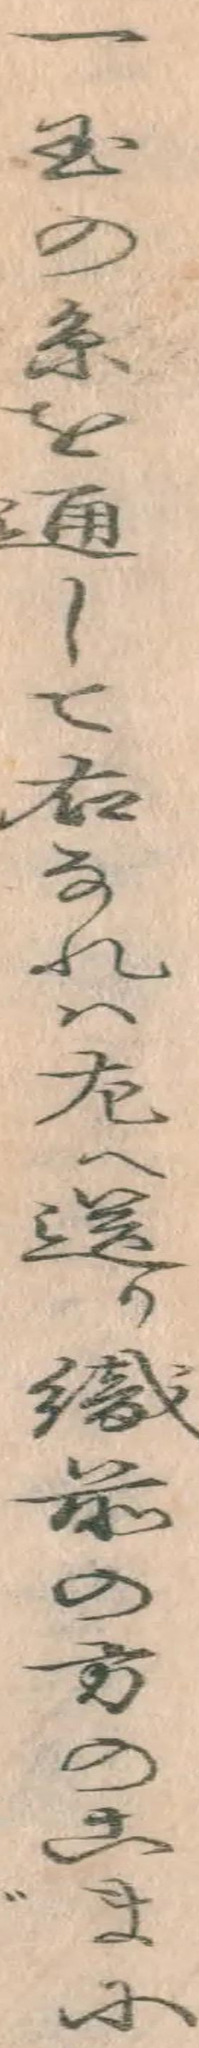一玉の糸を通して右なれは左へ送り織前の方のこまに
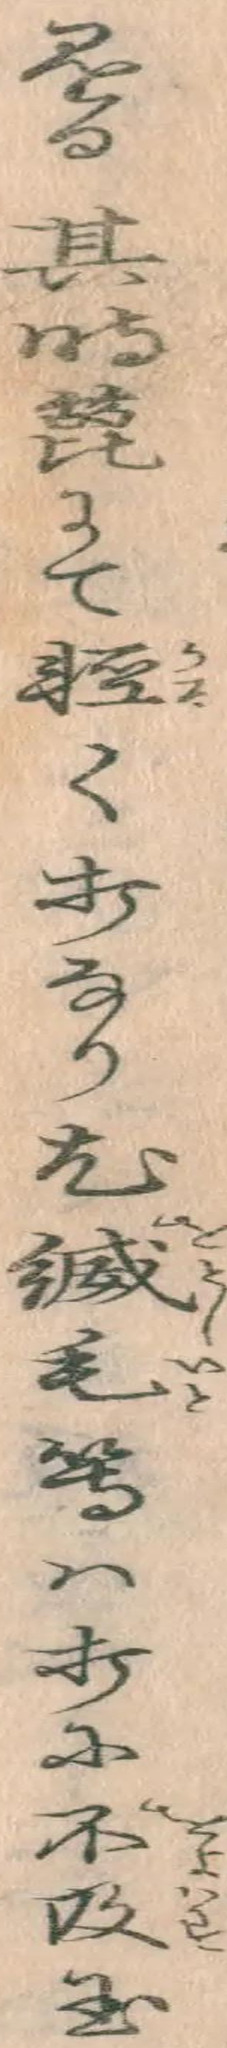懸る其時箆にて軽く打なり尤縅糸等は打に不及玉
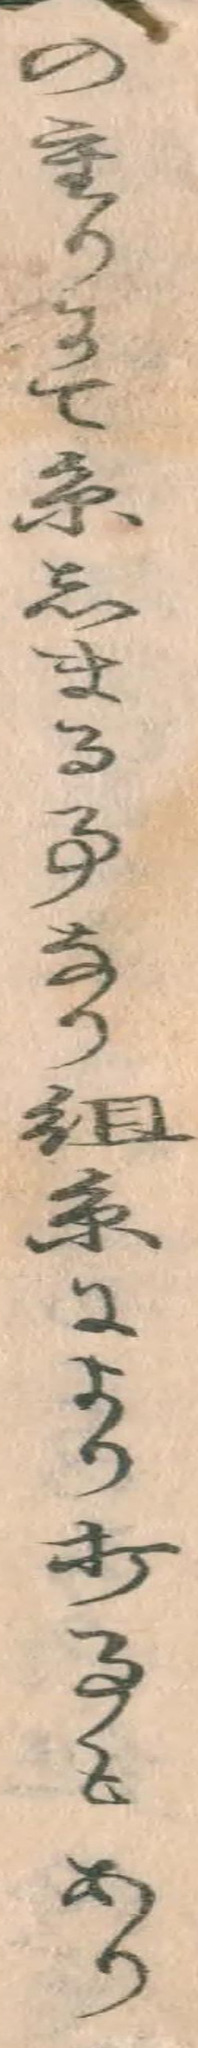の重りにて糸しまる事なり組糸により打事もあり
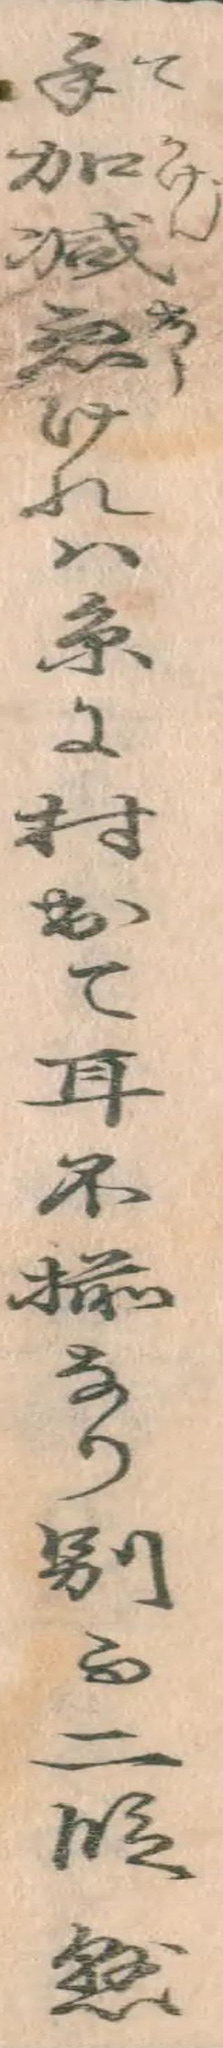手加減悪けれは糸に村出て耳不揃なり別而二段懸
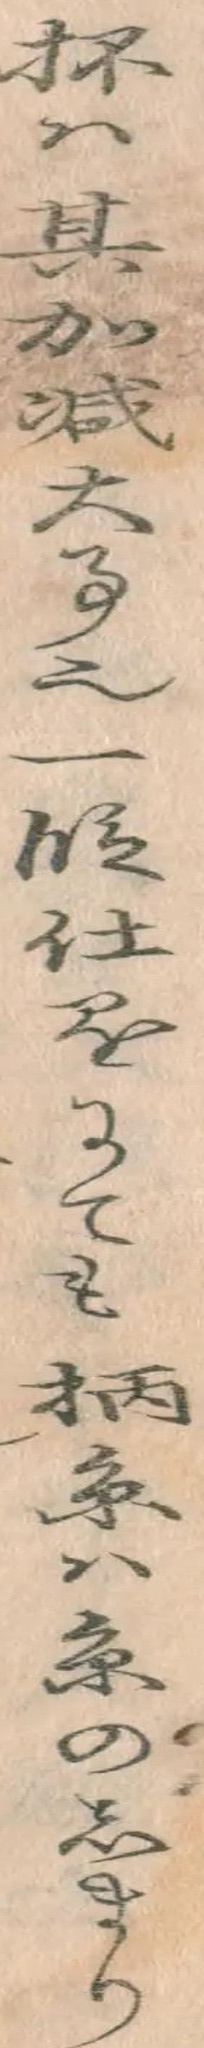抔は其加減大事也一段仕懸にても柄糸は糸のしまり
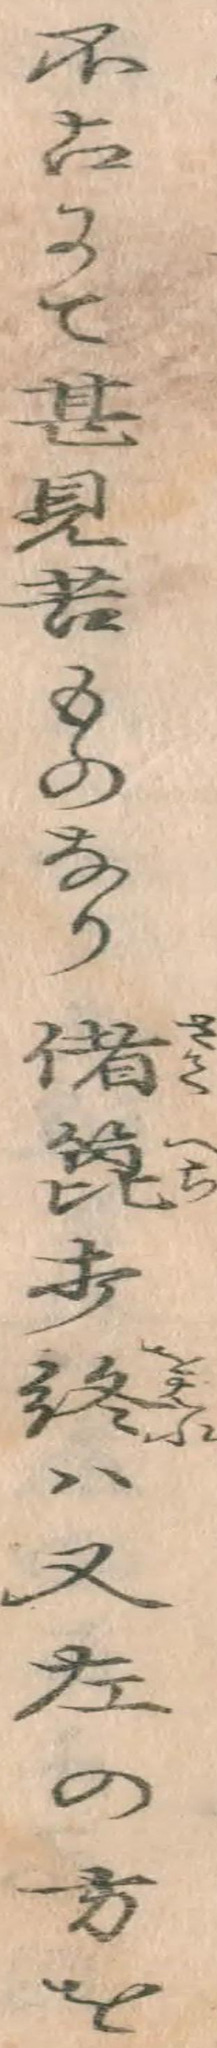不占にて甚見苦ものなり偖箆打終は又左の方を
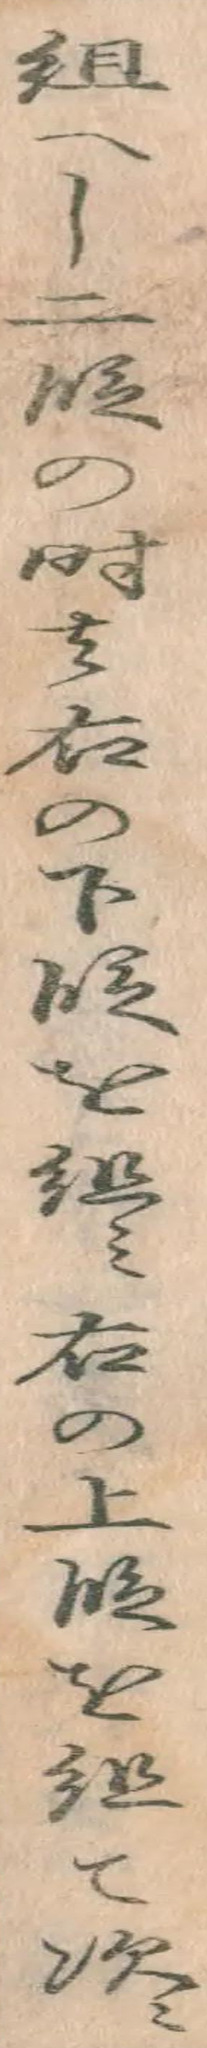組へし二段の時は右の下段を組み右の上段を組て次に

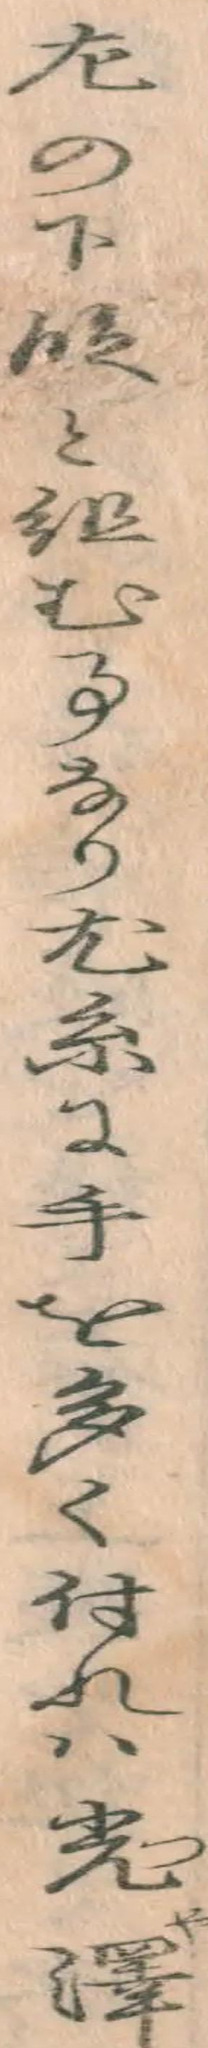左の下段と組む事なり尤糸に手を多く付れは光沢
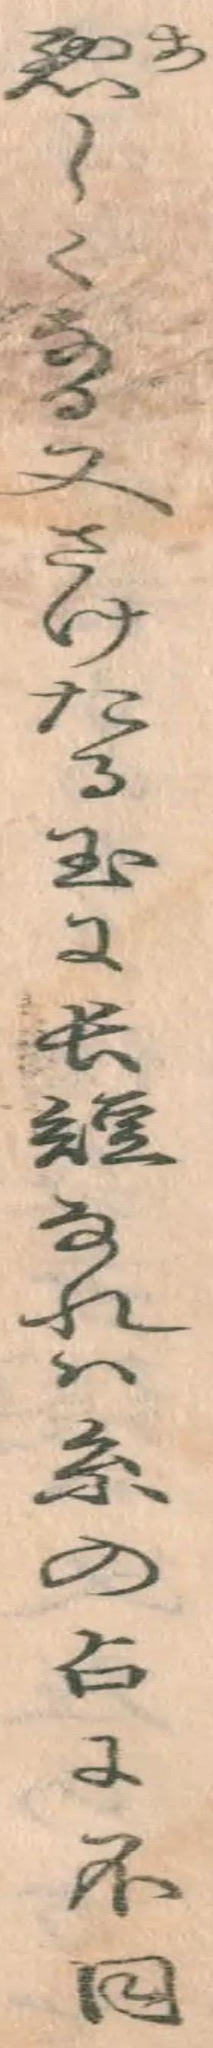悪しくなる又さけたる玉に長短なれは糸の占に不同
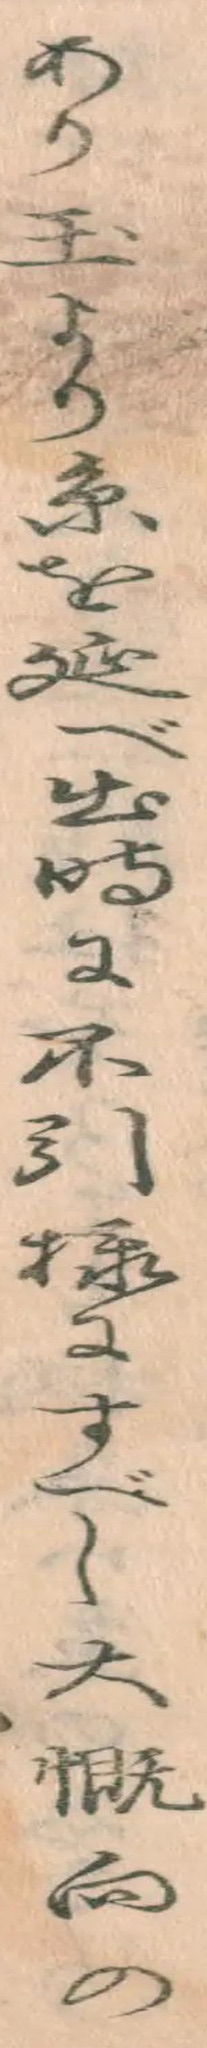あり玉より糸を延べ出時に不引様にすべし大慨向の
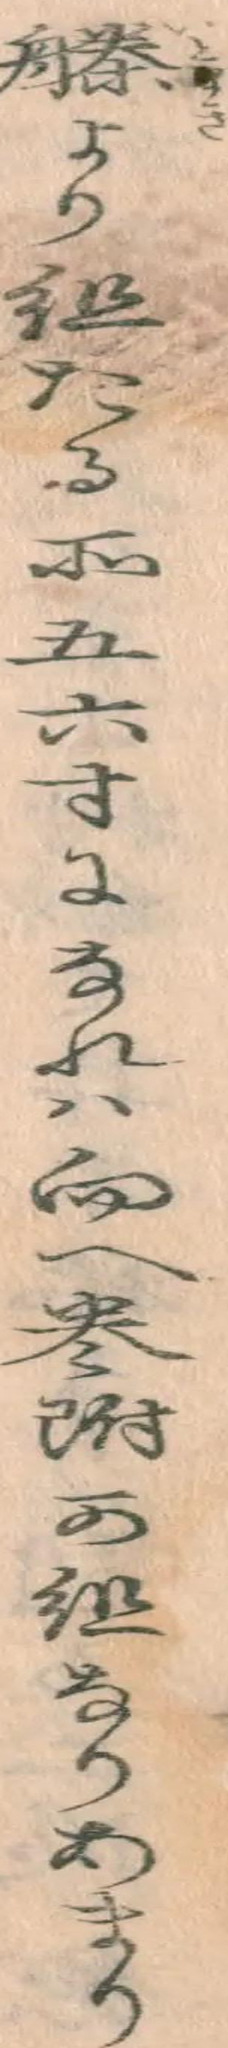𣚗より組たる所五六寸になれは向へ巻附可組なりあまり
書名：機織彙編 5巻. [2]
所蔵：国立国会図書館 National Diet Library, JAPAN
